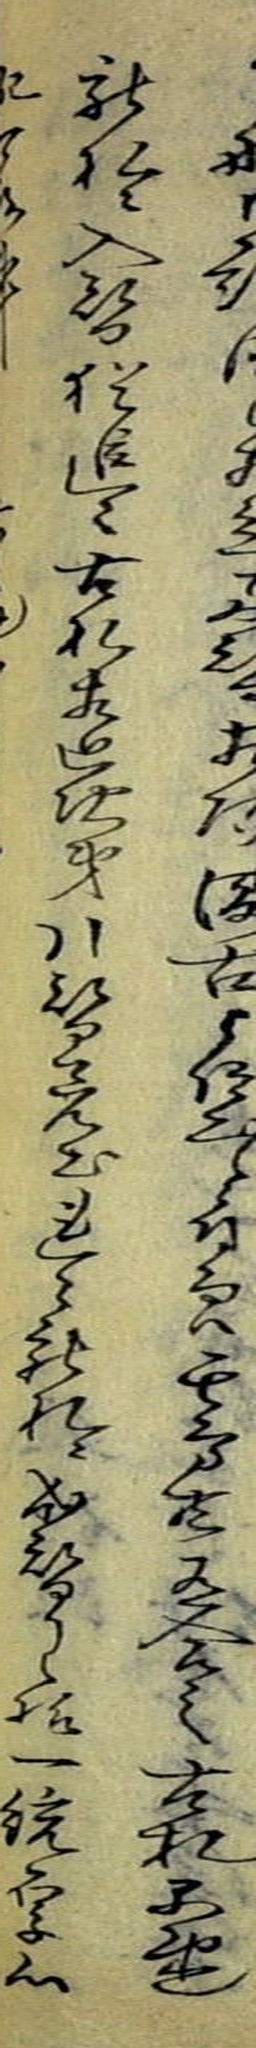新札に入替猶追々古札相廻り次第引替差出追々新札に成替り候様一統厚心
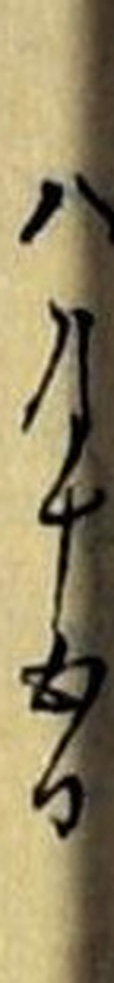八月十五日
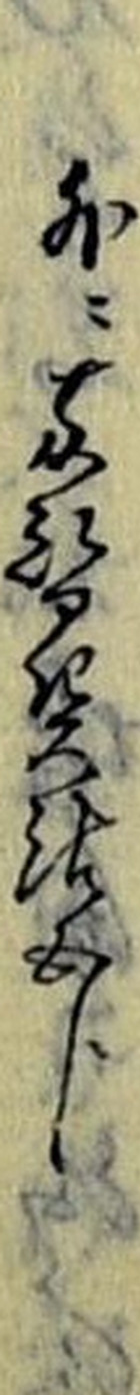外に両替賃銀五分
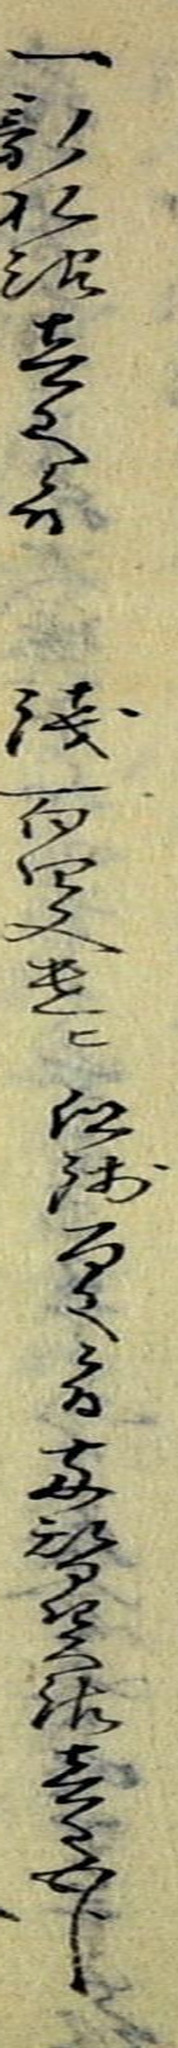一新札銀壱匁に付銭百四文遣ひ但銭百匁に付両替賃銀壱匁五分
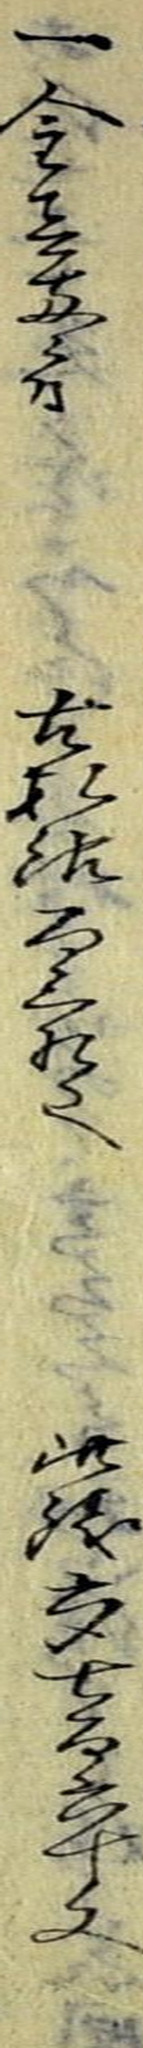一金壱両に付古札銀百三拾匁此銭六貫七百六十文
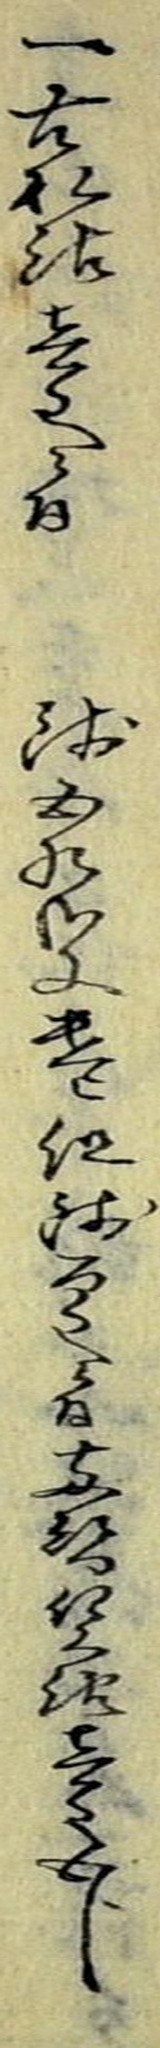一古札銀壱匁に付銭五拾弐文遣ひ但銭百匁に付両替賃銀壱匁五分
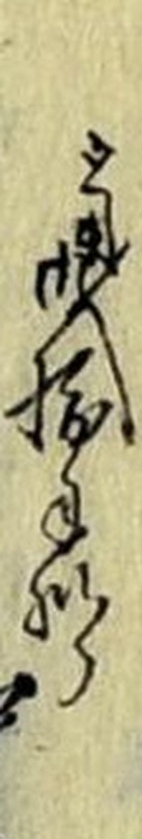御勝手掛り
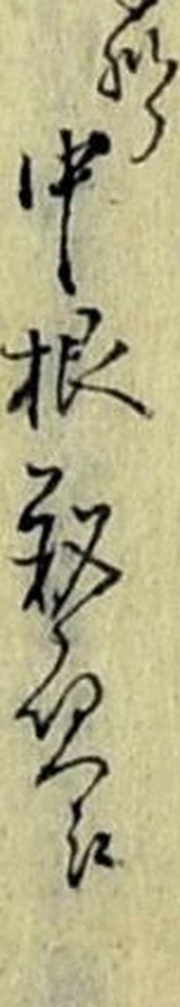中根靭負江
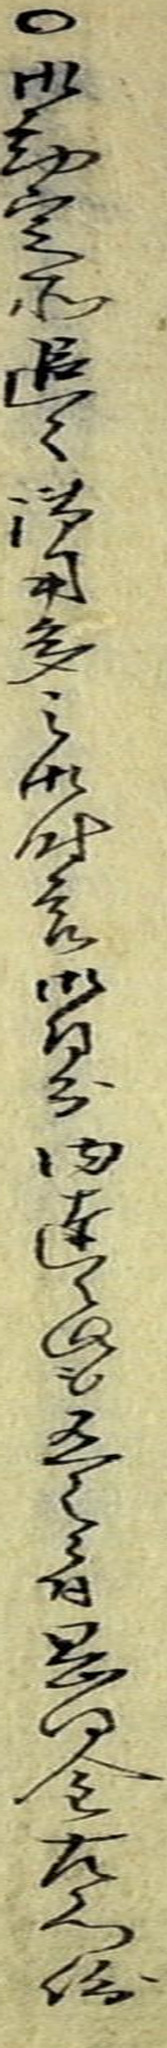○御勘定所追々御用多之御時節御自分内達之趣も有之に付岡田金左衛門儀
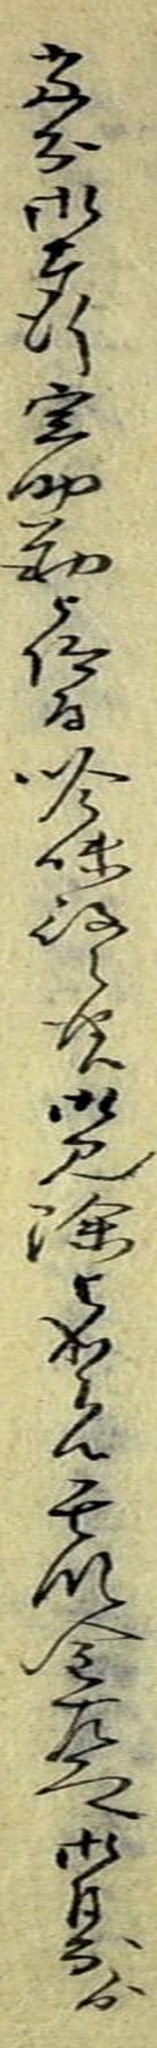当分御奉行定助勤被仰付吟味役之儀は御見除被成下候其段金左衛門へ御自分ゟ
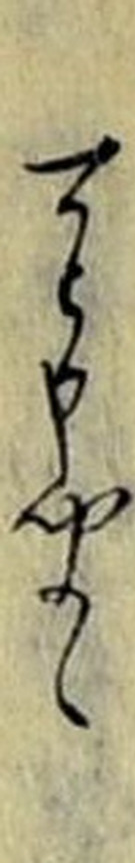可被申聞候
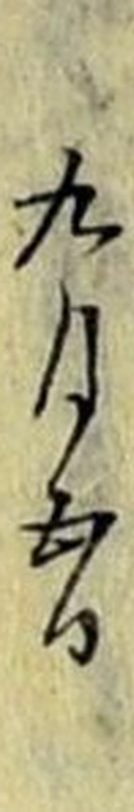九月五日
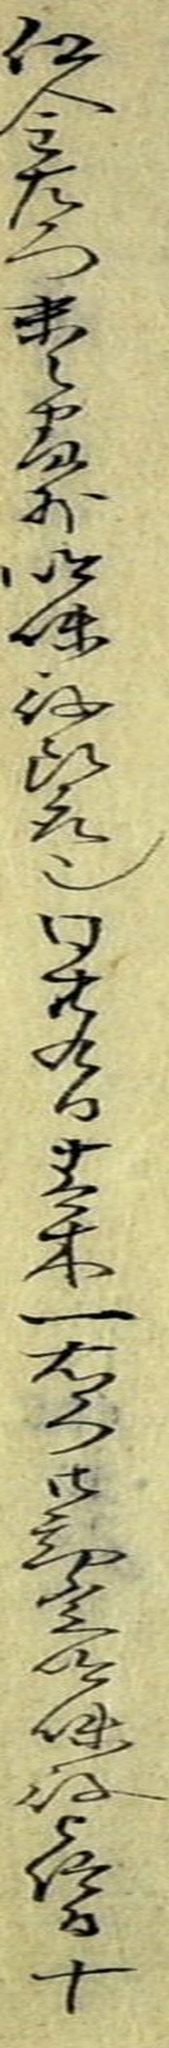但金左衛門末之番外吟味役頭取也同廿九日青木一右衛門御勘定吟味役被仰付十
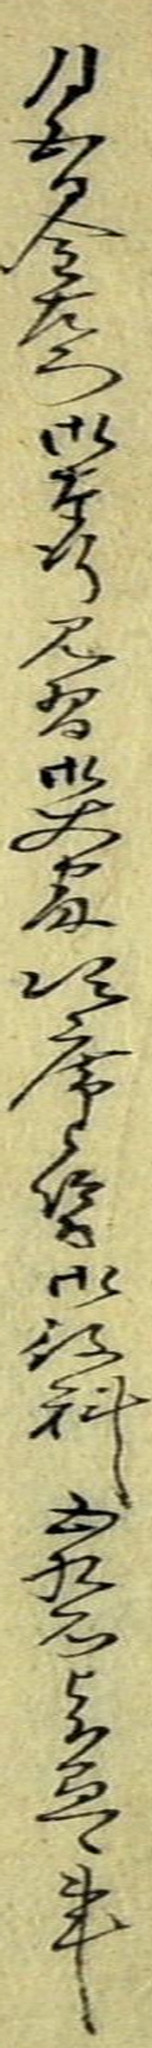月五日金左衛門御奉行見習御使番次席被仰付御役料五拾石被下置候事

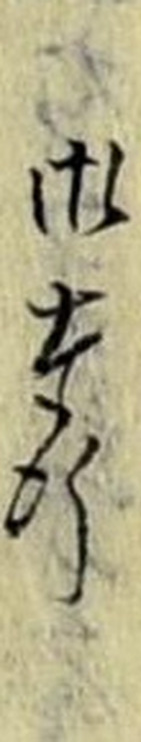御奉行
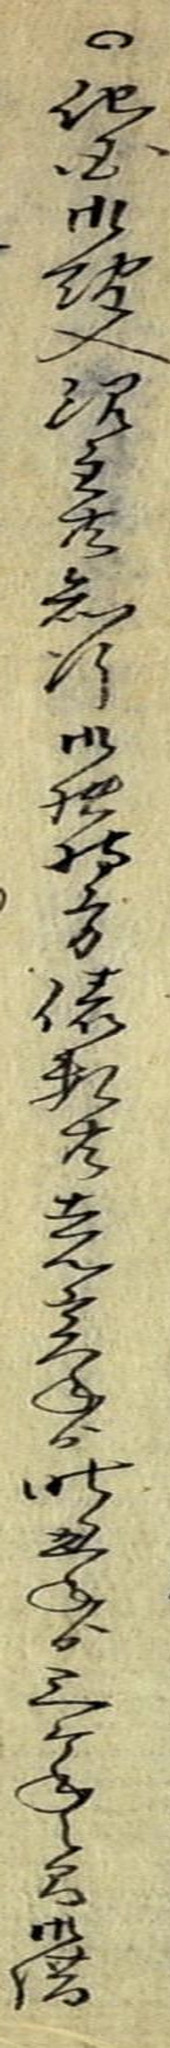○他国御館入銀主共知行御扶持方俵数共去亥年ゟ昨丑年ゟ三ヶ年之間御借
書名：命令之部 六
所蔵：福井県文書館 Fukui Prefectural Archives
